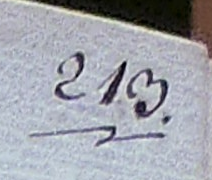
213.
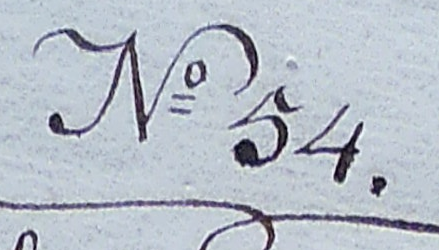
No͇ 54.
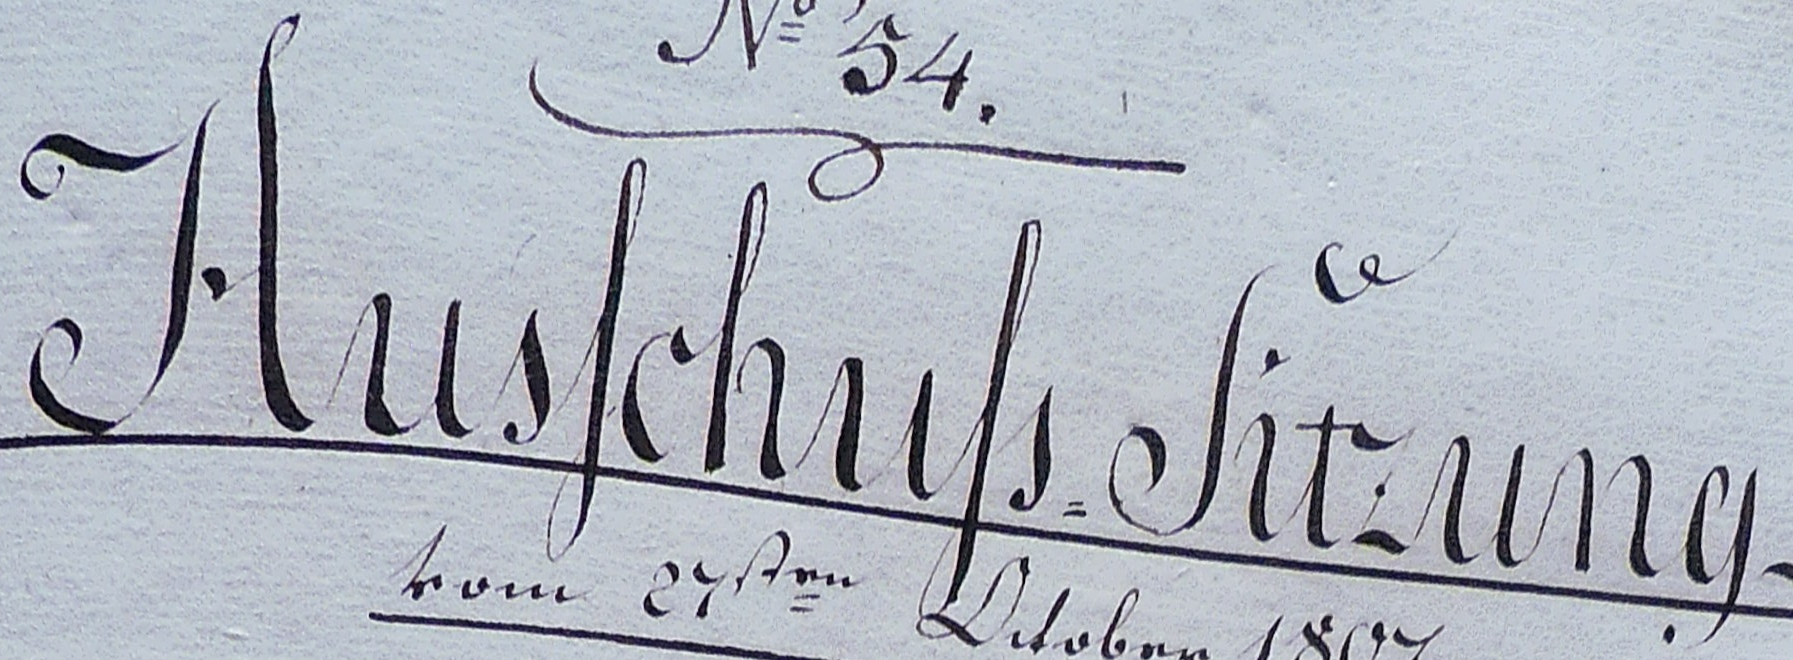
Ausschuss=Sitzung
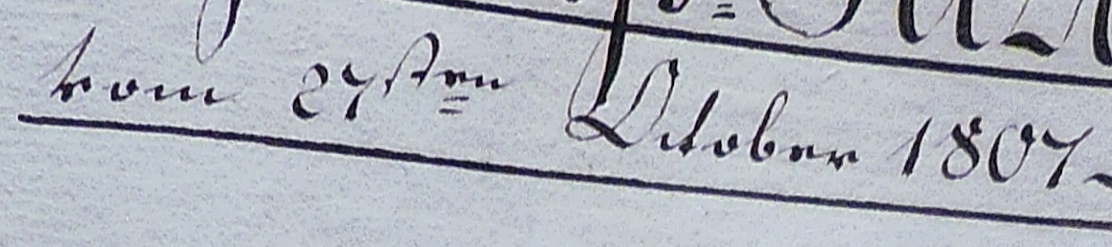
vom 27ste͇n October 1807.
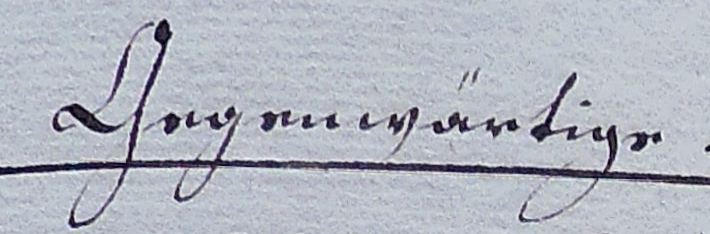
Gegenwärtige.
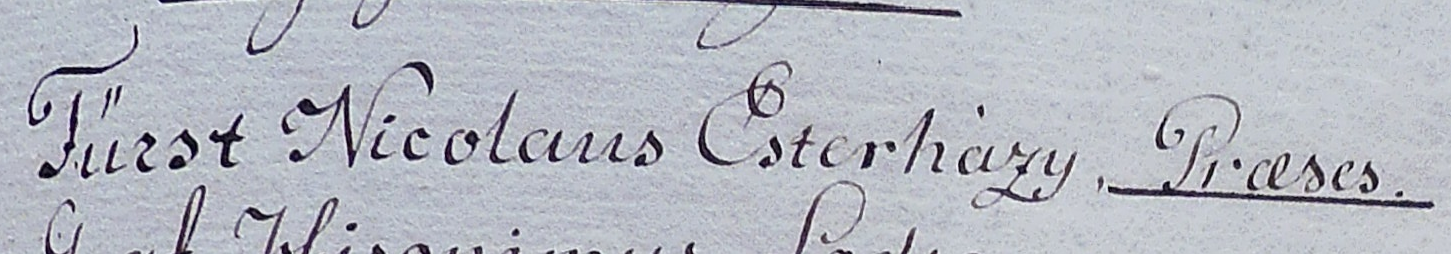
Fürst Nicolaus Esterhàzy Præses.
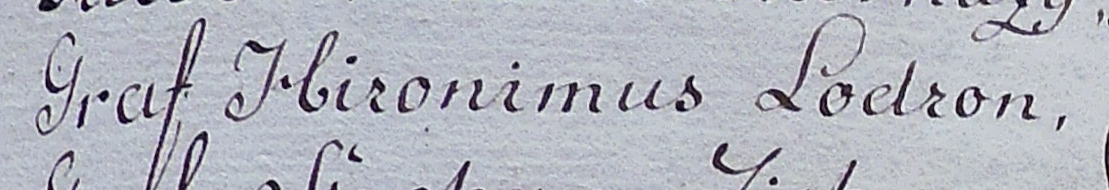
Graf Hironimus Lodron,
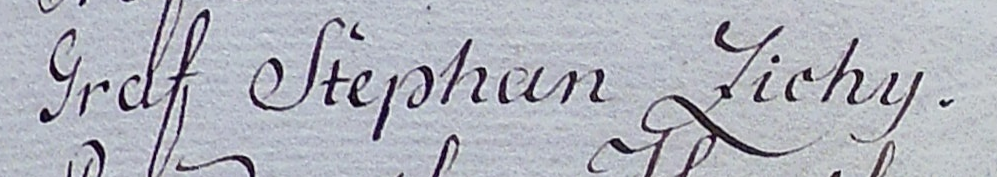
Graf Stephan Zichy.
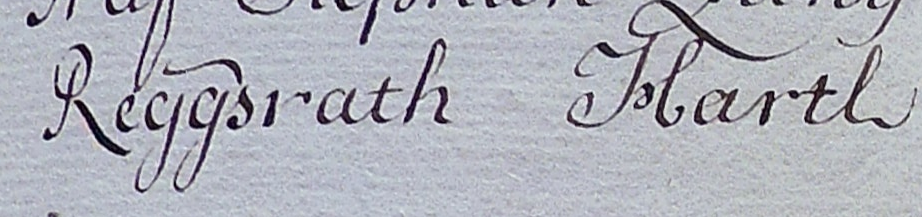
Reg͞gsrath Hartl
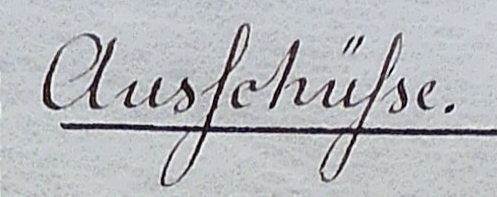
Ausschüsse.
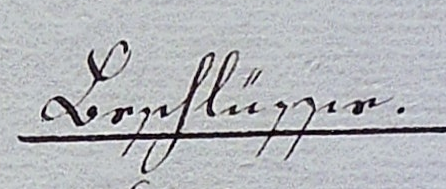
Beschlüsse.
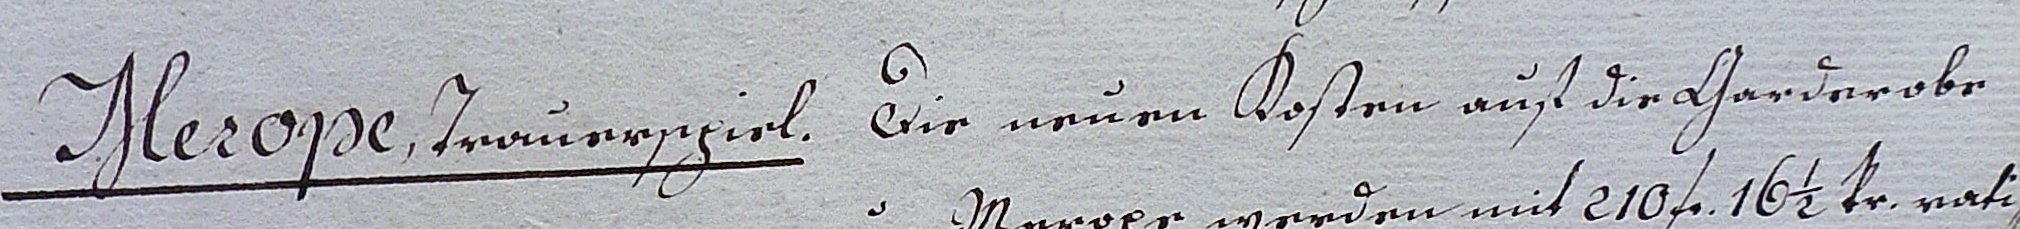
Merope, Trauerspiel. Die neuen Kosten auf die Garderobe
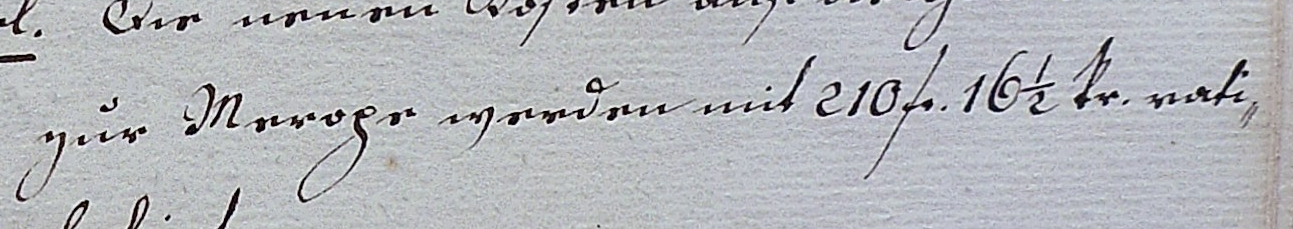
zur Merope werden mit 210fr. 16 1/2 kr. rati¬
